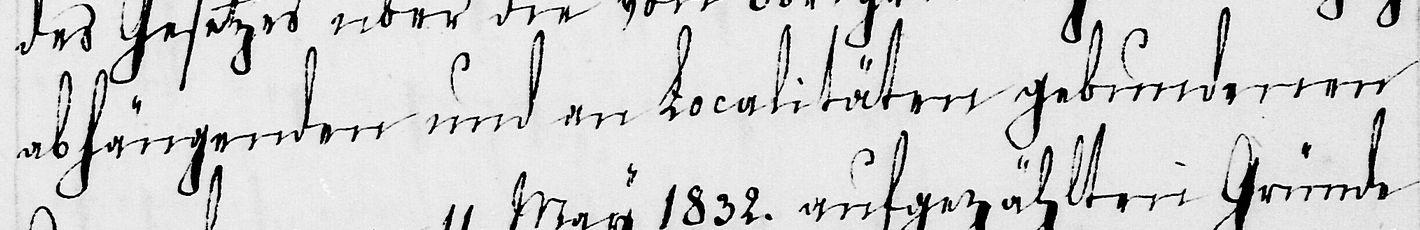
abhängenden und an Localitäten gebundenen
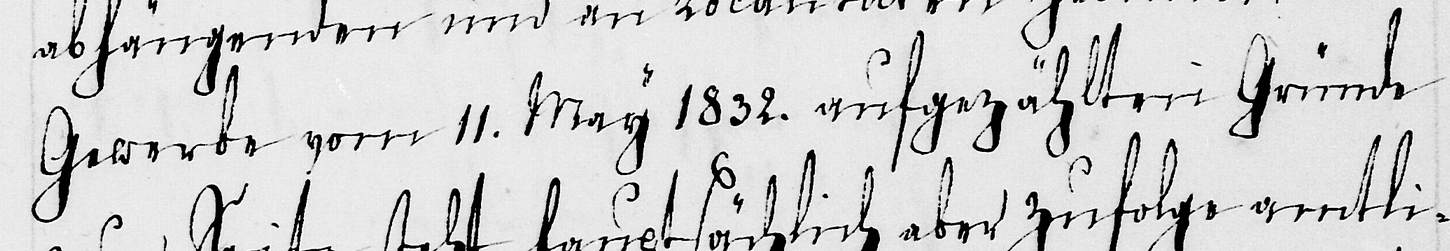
Gewerbe vom 11. May 1832. aufgezählten Gründe
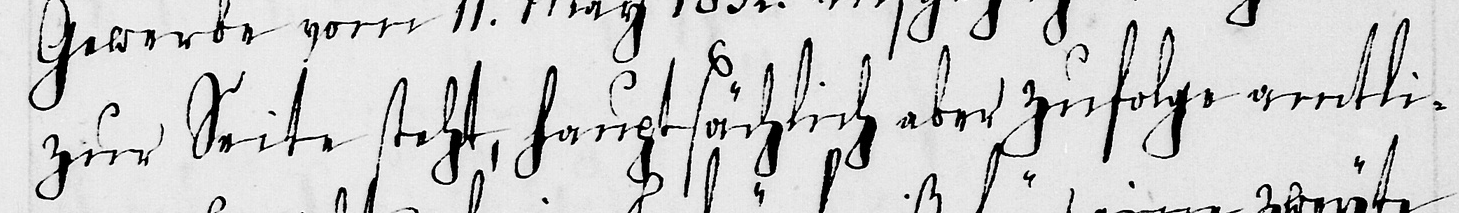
zur Seite steht, hauptsächlich aber zufolge amtli¬
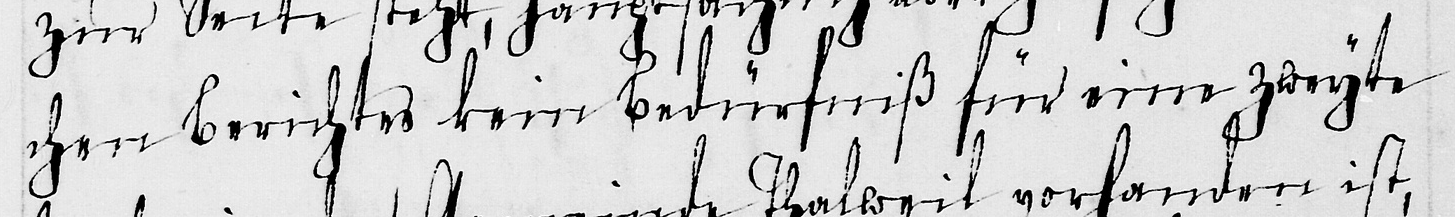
chen Berichtes kein Bedürfniß für eine zweyte
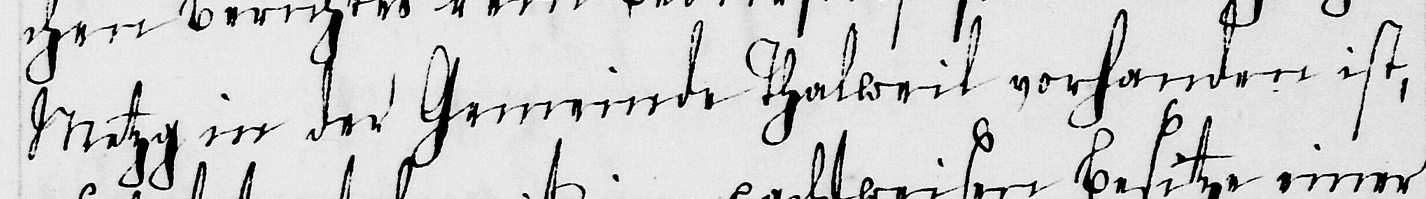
Metzg in der Gemeinde Thalweil vorhanden ist,
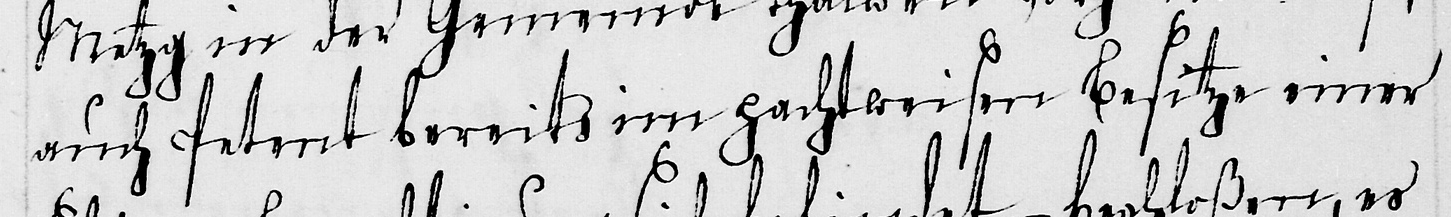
auch Petent bereits im pachtweisen Besitze einer
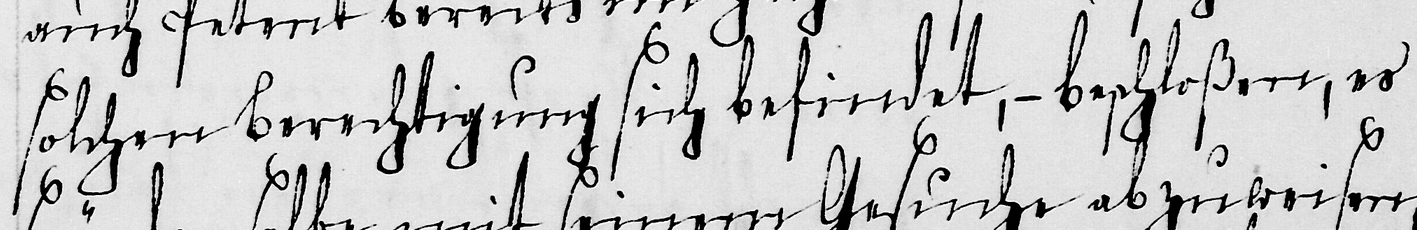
solchen Berechtigung sich befindet, – beschloßen, es
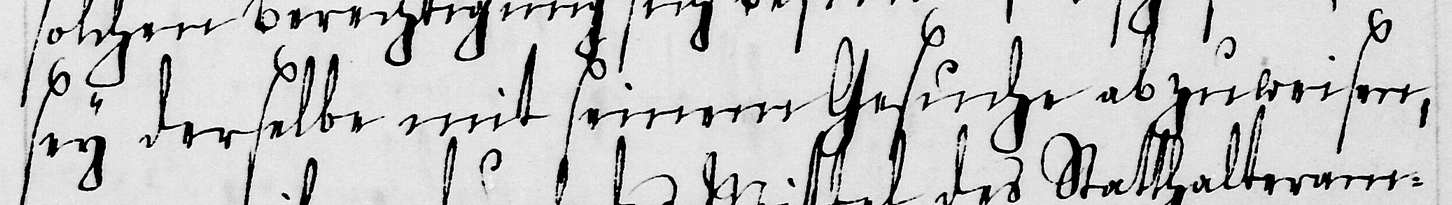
sey derselbe mit seinem Gesuche abzuweisen,
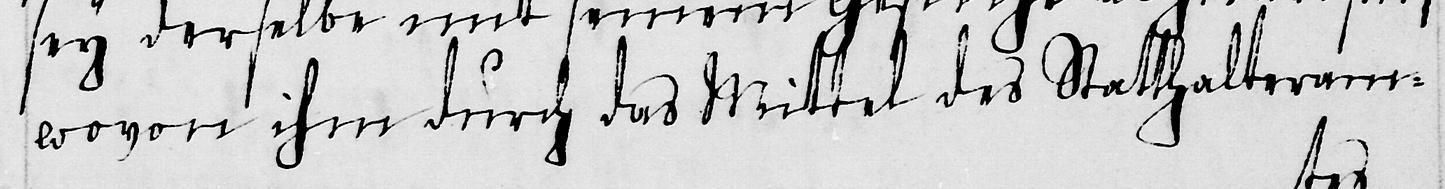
wovon ihm durch das Mittel des Statthalteram-
